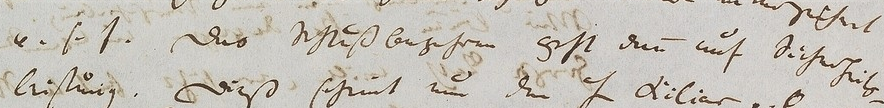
&. s. f. Das Schlußbegehren geht denn auf Sicherheits-
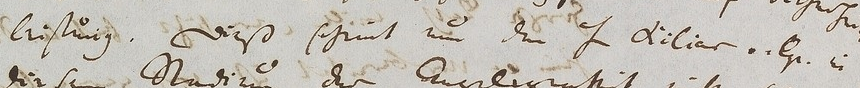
leistung. Dieß scheint nun den H. Kilias &. Cp. in
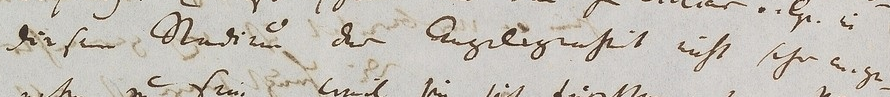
diesem Stadium der Angelegenheit nicht sehr ange-
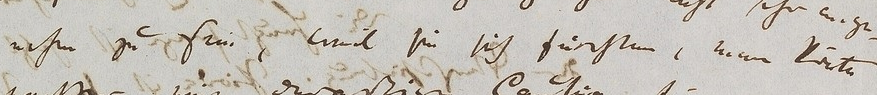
nehm zu sein, weil sie sich fürchten, man könnte
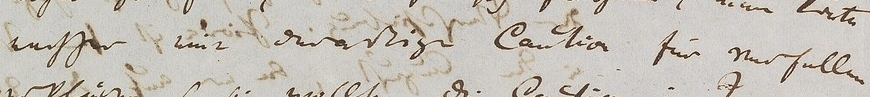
nachher eine derartige Caution für verfallen
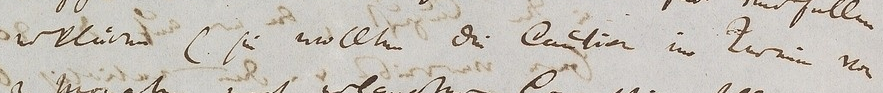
erklären (sie wollten die Caution im Termin von
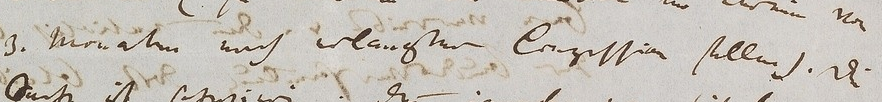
3 Monaten nach erlangter Conzession stellen). Die
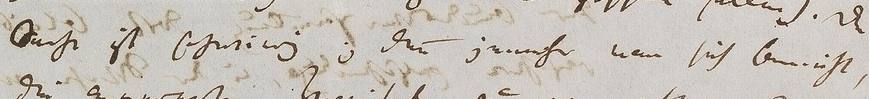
Sache ist schwierig; denn jemehr man sich bemüht,
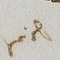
mehr
